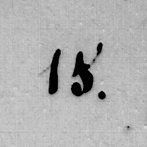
4.
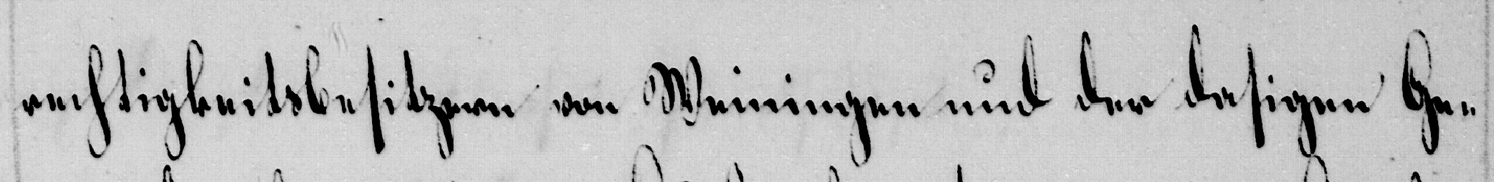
rechtigkeitsbesitzern von Weiningen und der dasigen Ge¬
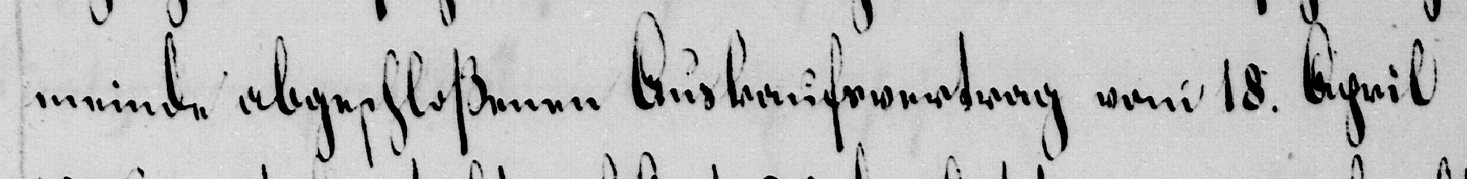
meinde abgeschloßenen Auskaufsvertrag vom 18. April
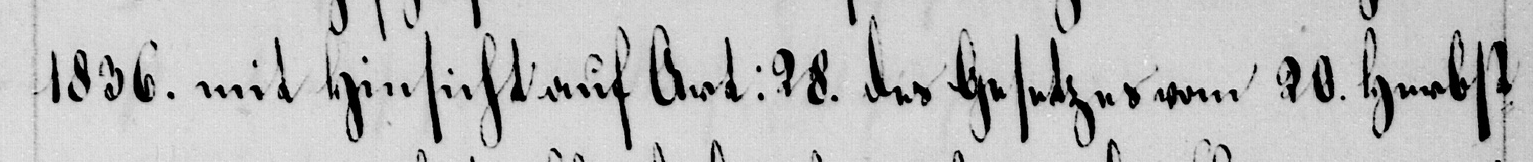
1836. mit Hinsicht auf Art: 28. des Gesetzes vom 20. Herbst¬
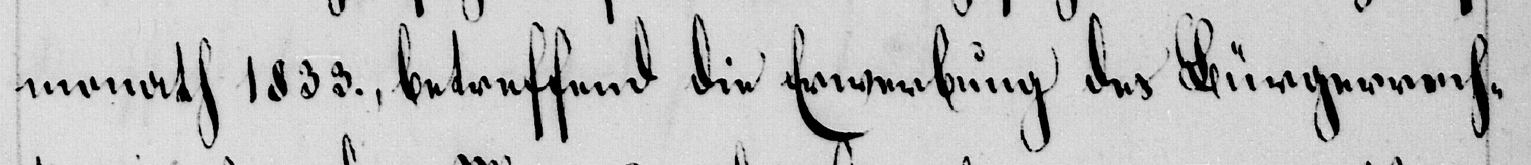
monath 1833., betreffend die Erwerbung des Bürgerrech¬
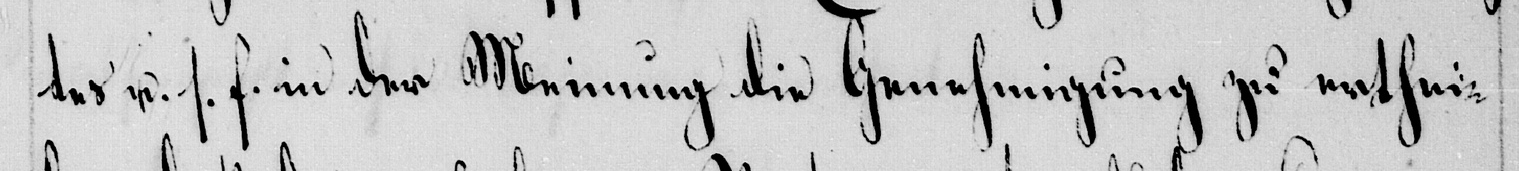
tes u. s. f. in der Meinung die Genehmigung zu erthei¬
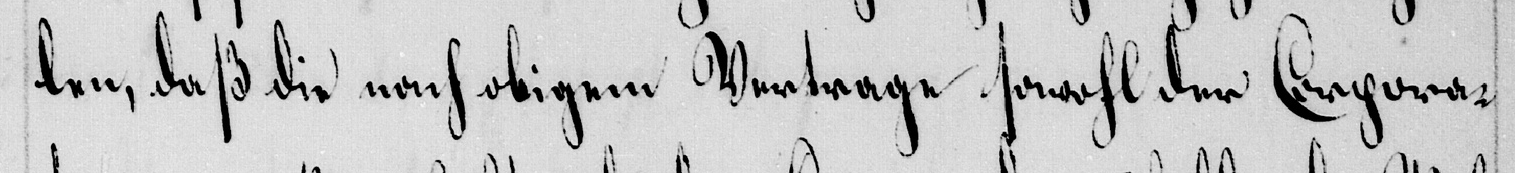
len, daß die nach obigem Vertrage sowohl der Corpora¬
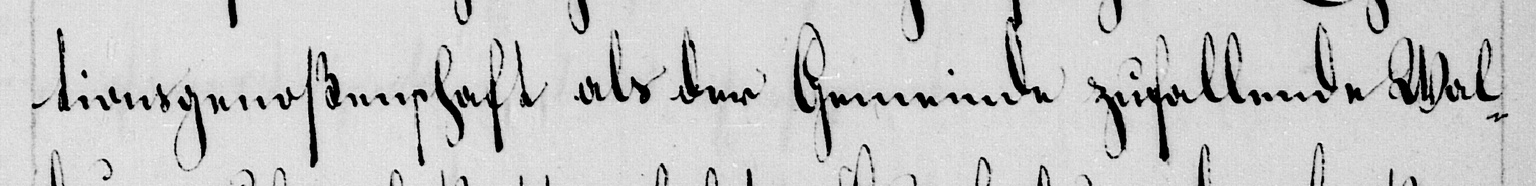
tionsgenoßenschaft als der Gemeinde zufallende Wal¬
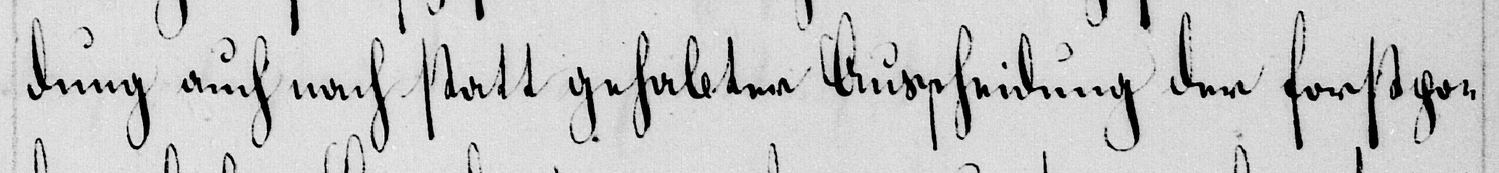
dung auch nach statt gehabter Ausscheidung der forstpo¬
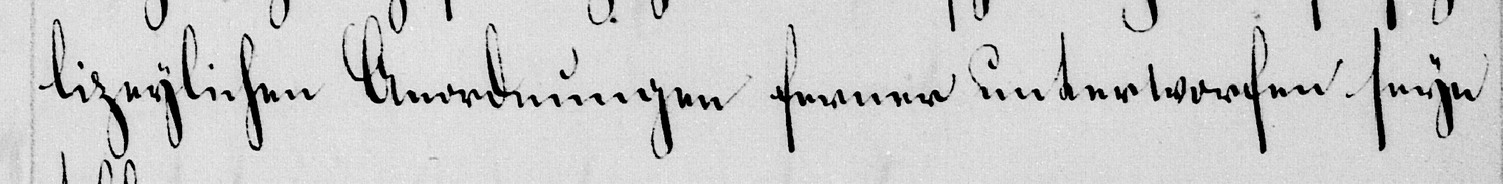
lizeylichen Anordnungen ferner unterworfen seyn
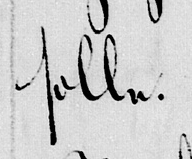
solle.
